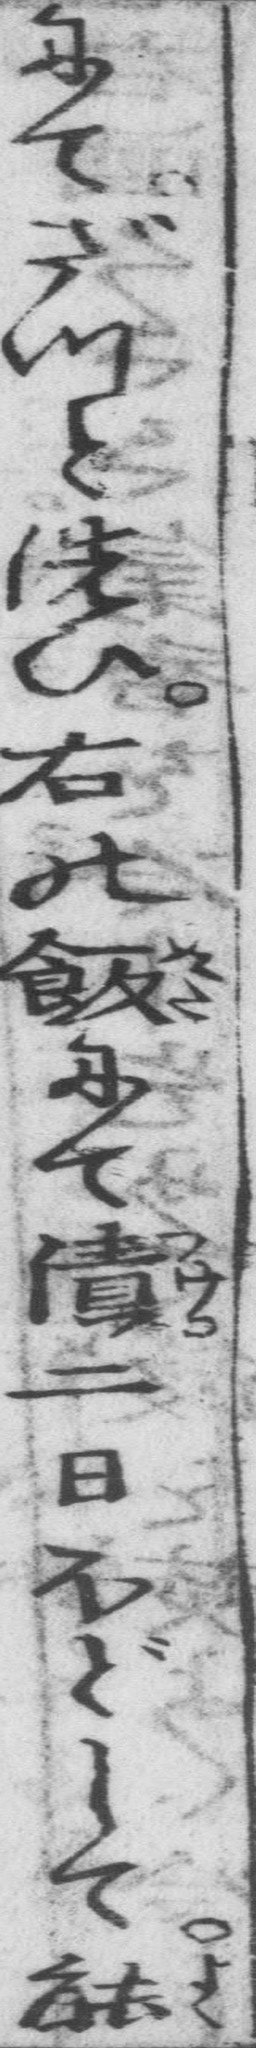にて。ざつと洗ひ。右の飯にて漬。二日ほどして。能
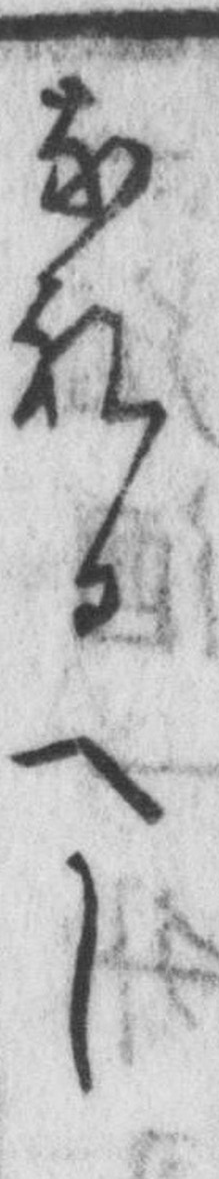なれるへし
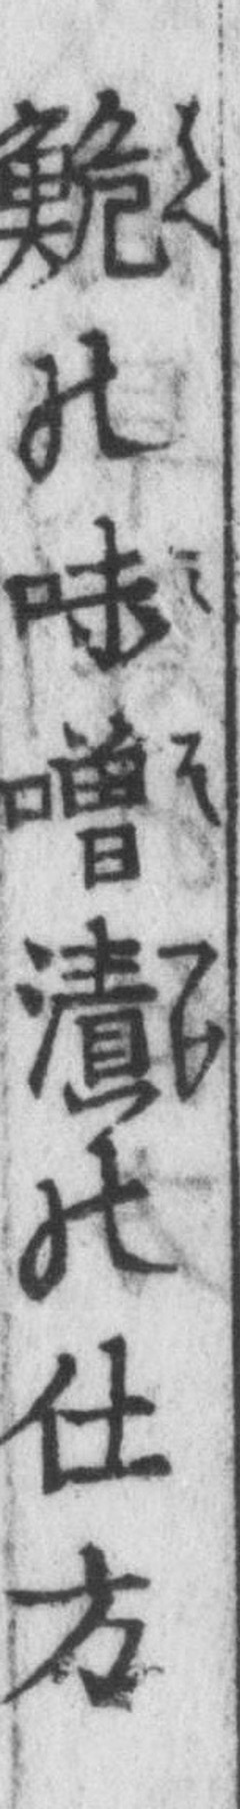鮠の味噌漬の仕方
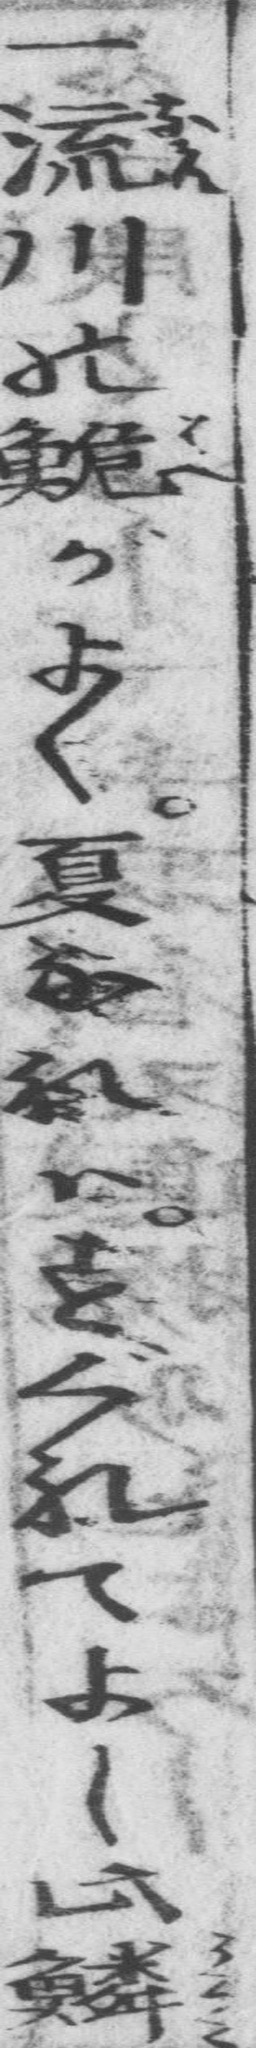一流川の鮠がよく。夏なれは。すぐれてよし此鱗
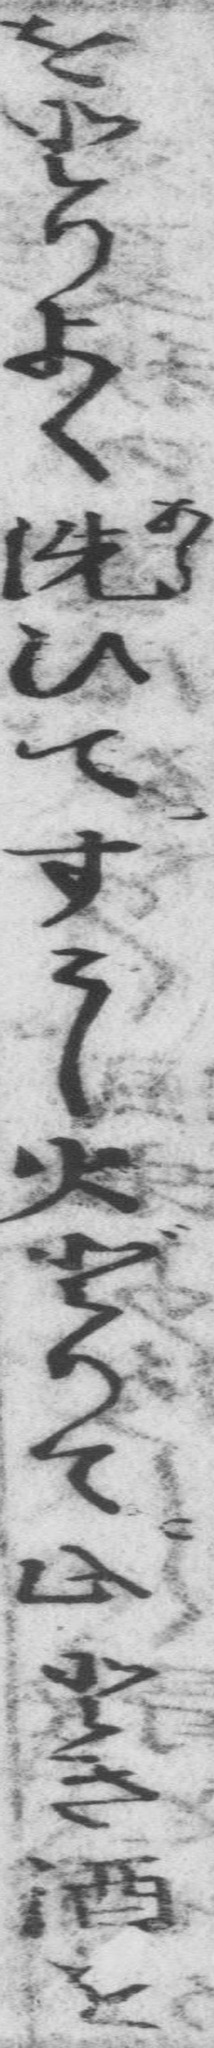をとりよく洗ひて。すこし火どりて。此とき酒を
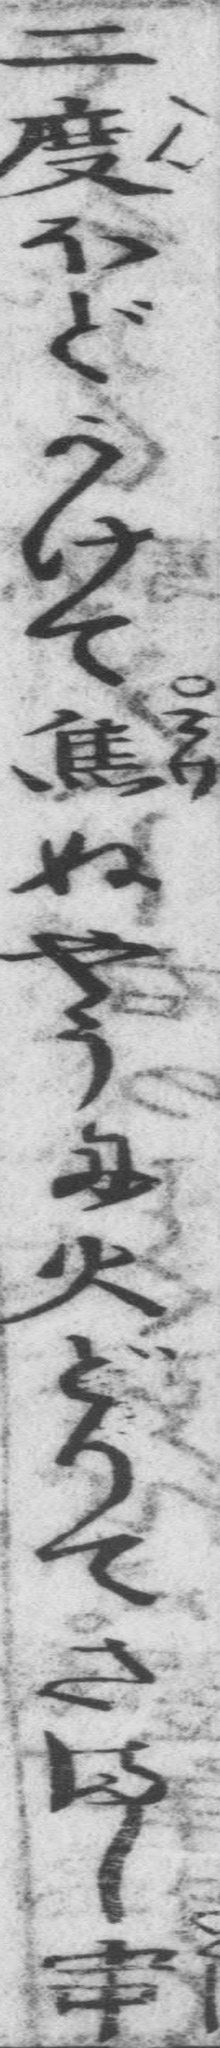二度ほどかけて。焦ぬやうに火どりてさまし。串
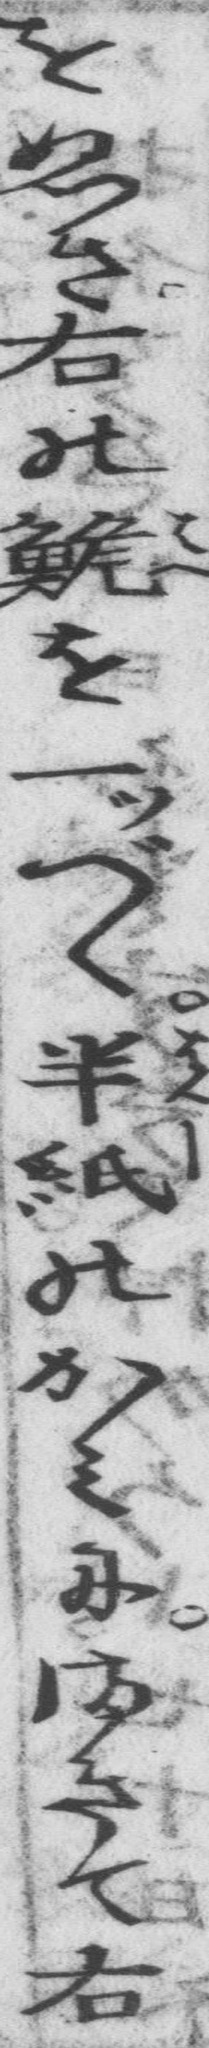をぬき。右の鮠を一ツづゝ。半紙のかみに。まきて右
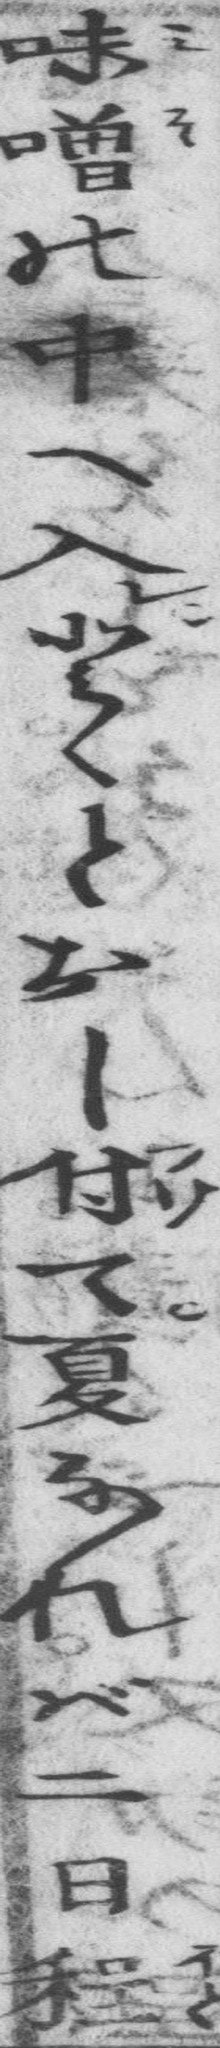味噌の中へ入れ。とくとおし付て。夏なれば二日程
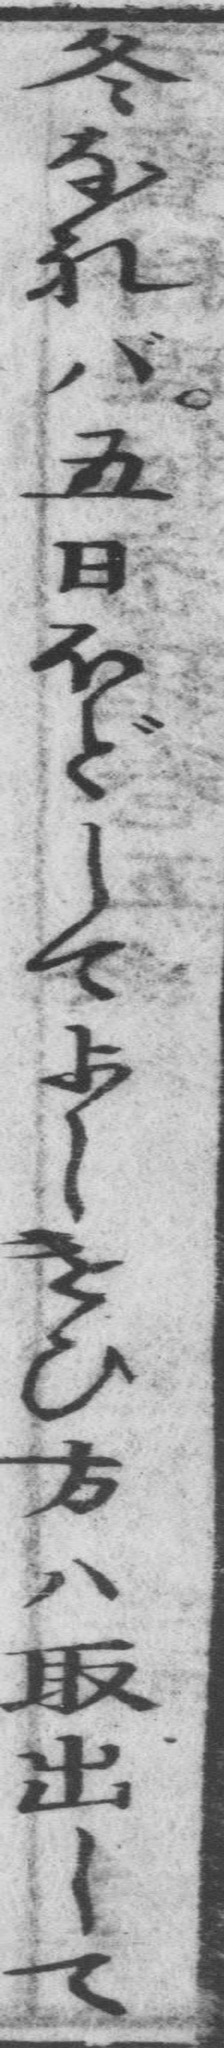冬なれば。五日ほどしてよし遣ひ方は取出して
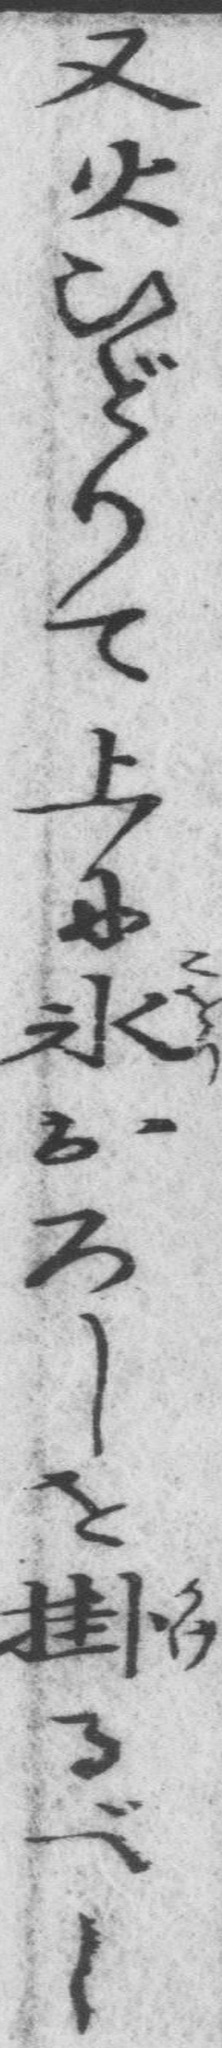又火ひどりて上に氷おろしを掛るべし
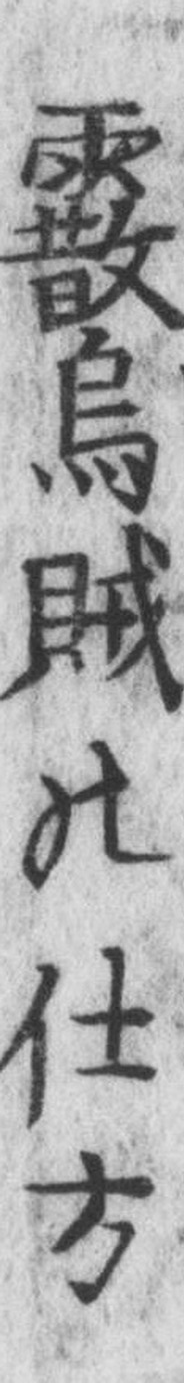霰烏賊の仕方
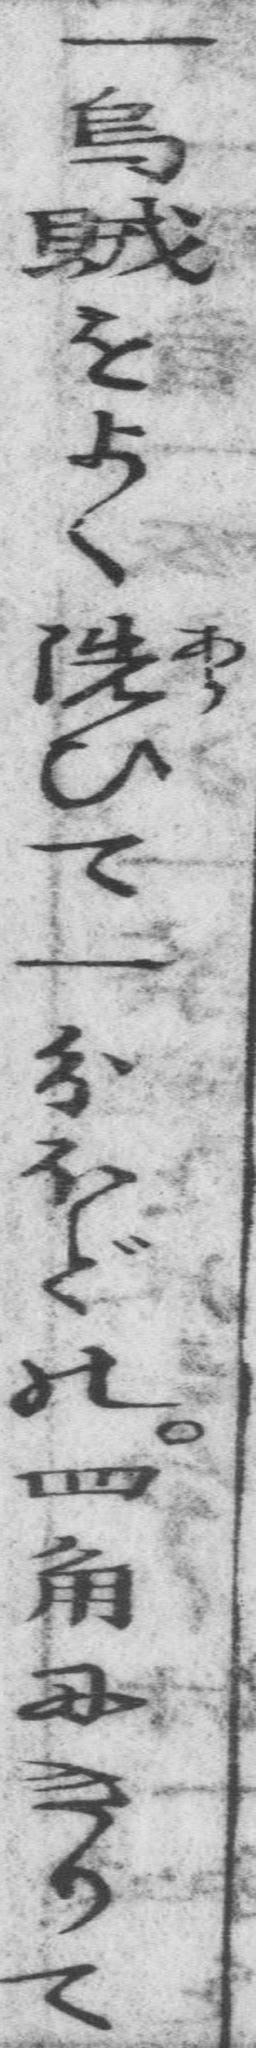一烏賊をよく洗ひて一分ほどの。四角にきりて
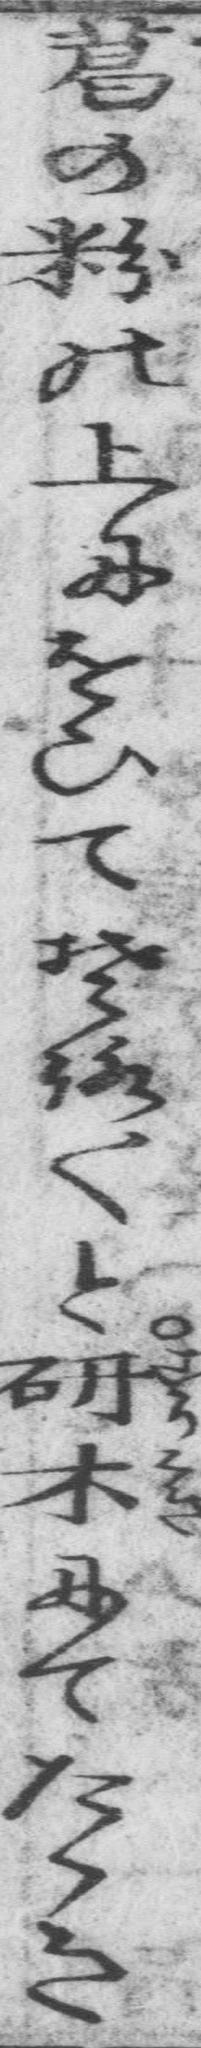葛の粉の上にをひてそろ〳〵と。研木にてたゝき
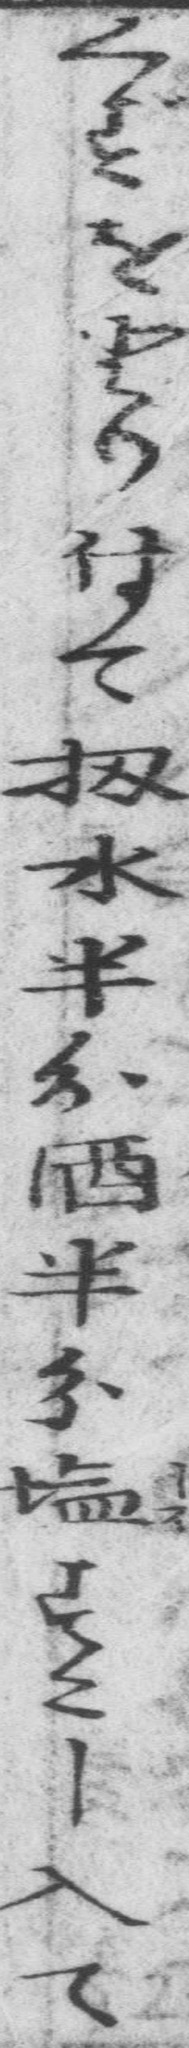くずをとり付て扨水半分酒半分塩すこし入て
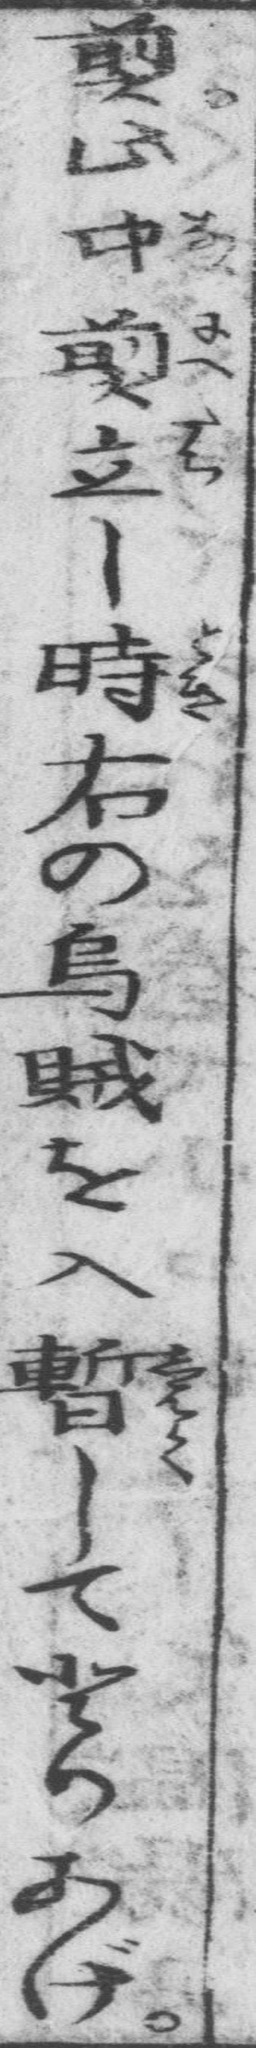煎。此中煎立し時右の烏賊を入暫してとりあげ。
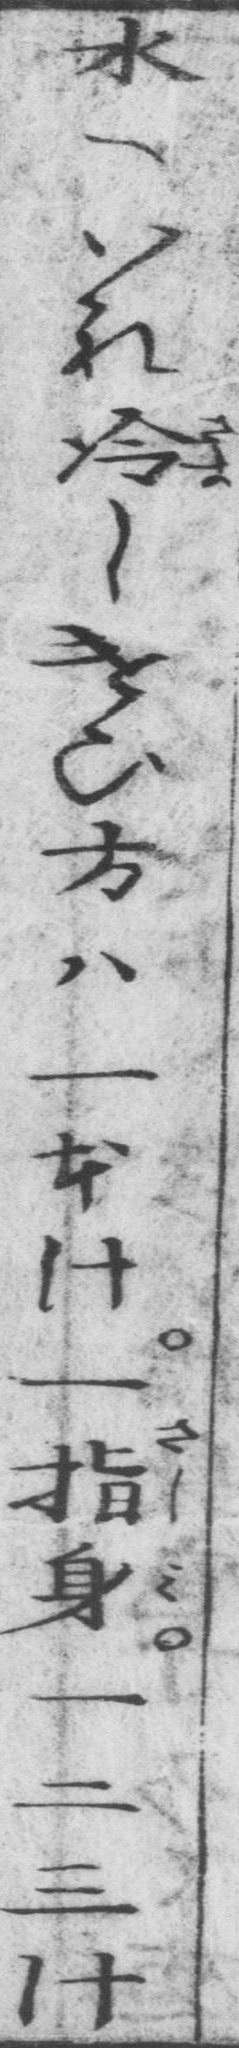水へいれ冷し遣ひ方は一本汁。一指身。一二三汁
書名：萬寳料理秘密箱
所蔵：大阪府立大学学術情報センター 国文学研究資料館
